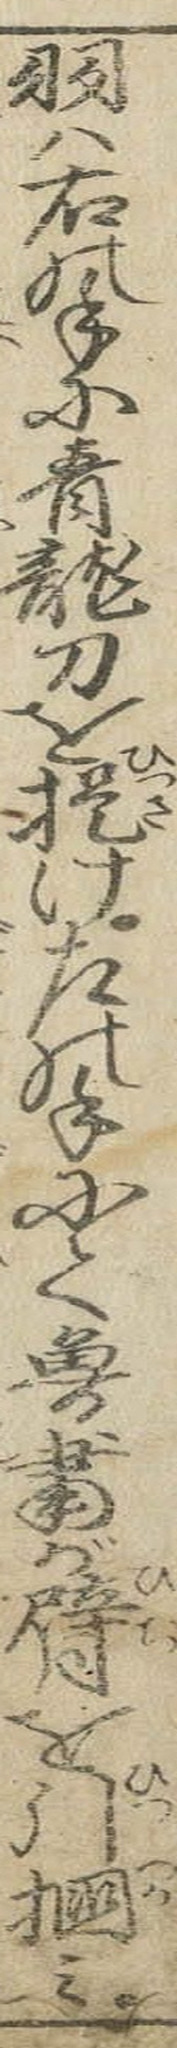羽は右の手に青龍刀を提け。左の手にて魯粛が臂を引掴み。
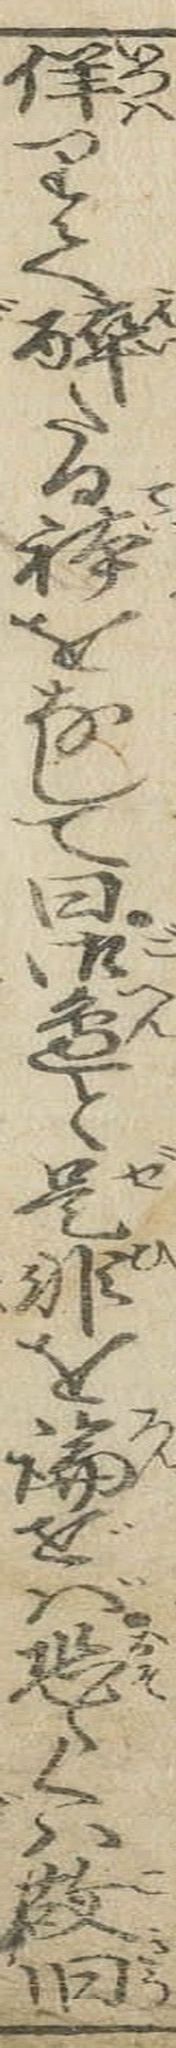佯りて醉たる体をなして曰。御辺と是非を論ぜば。恐らくは故旧
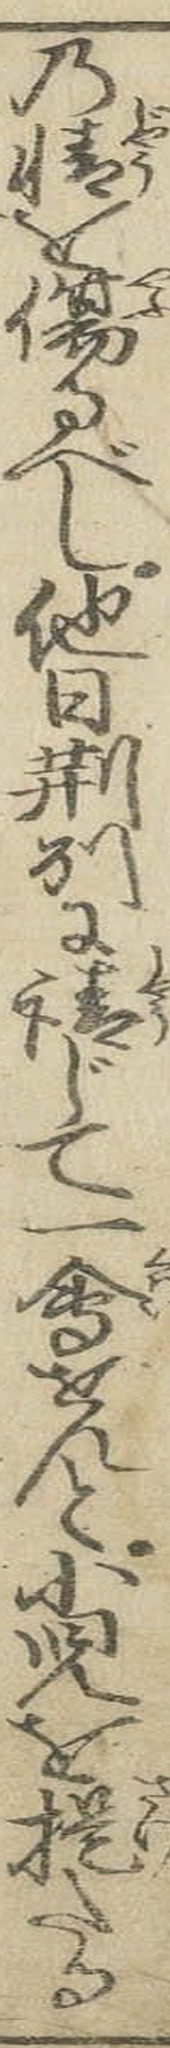の情を傷るべし。他日荊州に請じて一会せんと。小児を提たる
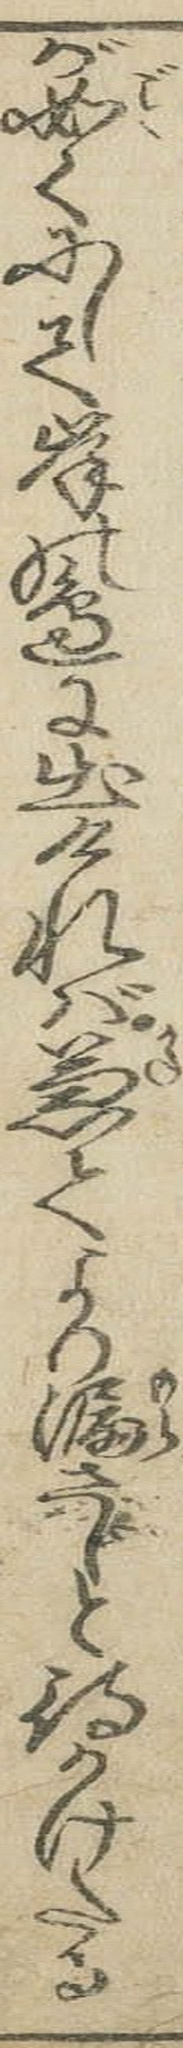が如くにして岸の辺に出ければ。兼てより漏さじと待かけたる
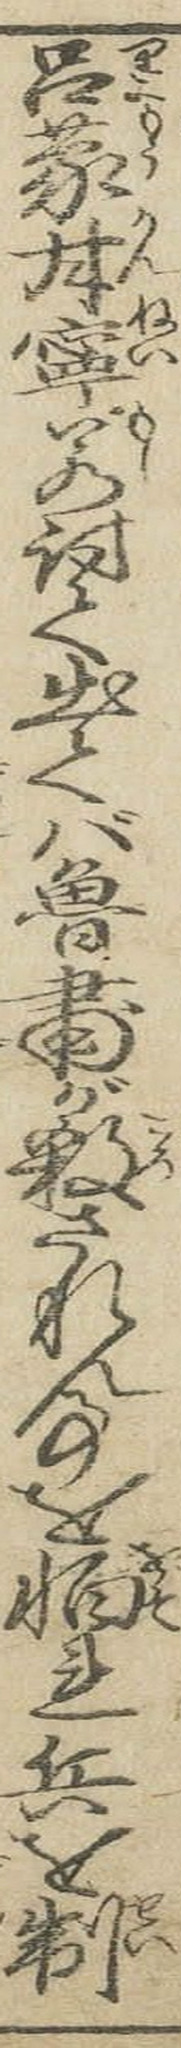呂蒙甘寧。若討て出てば魯粛が殺されん事を怕れ兵を制
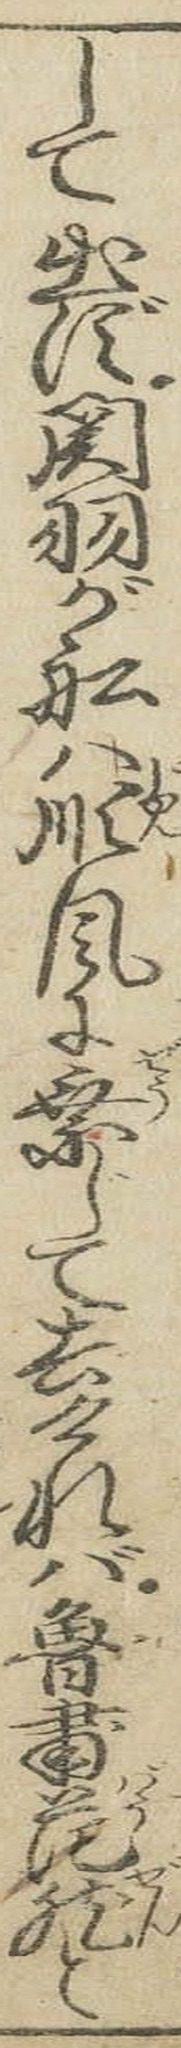して出ず。関羽が船は順風に乗じて去ければ。魯粛茫然と
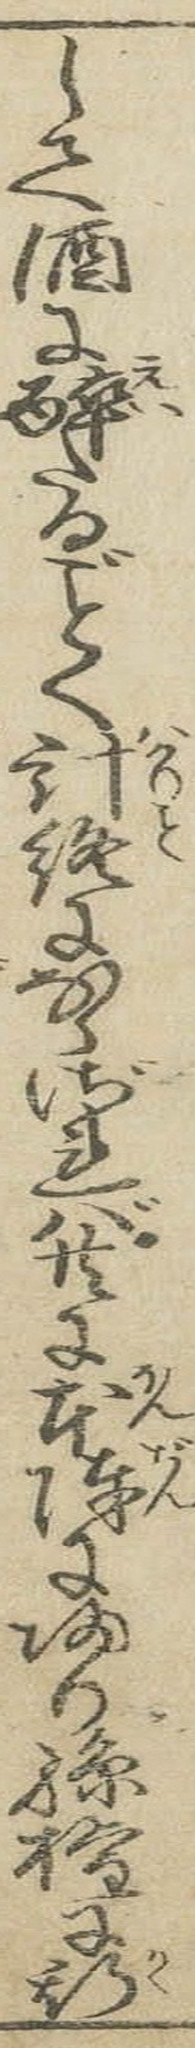して酒に醉たるごとく計終にならざれば。共に本陣に帰り孫権に斯
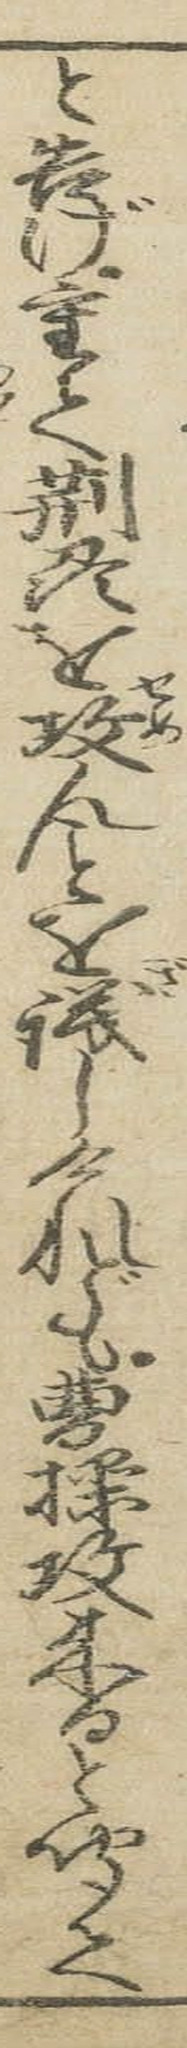と告げ。重て荊州を攻んことを議しけれども。曹操攻来ると聞て
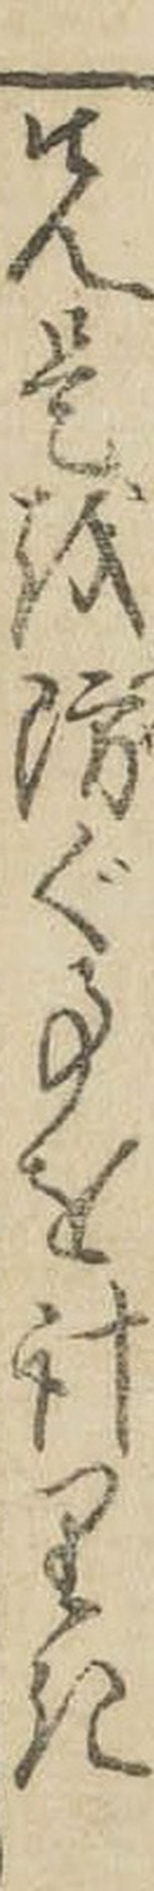先是を防ぐ事を計りき
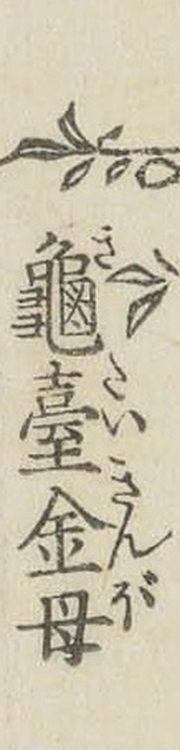亀台金母
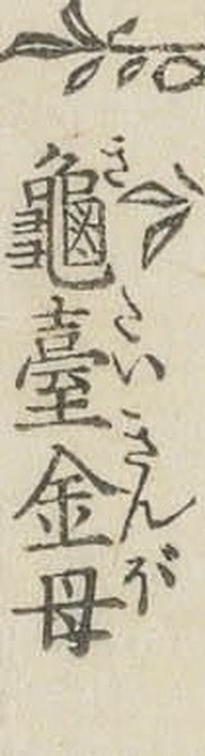亀台金母
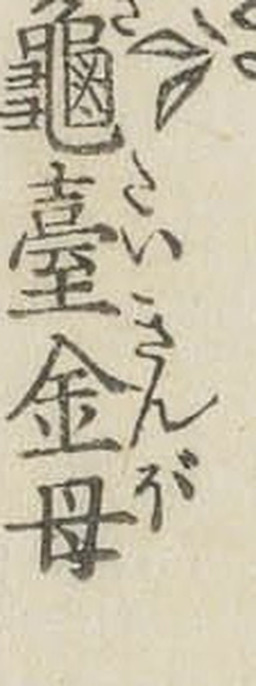亀台金母
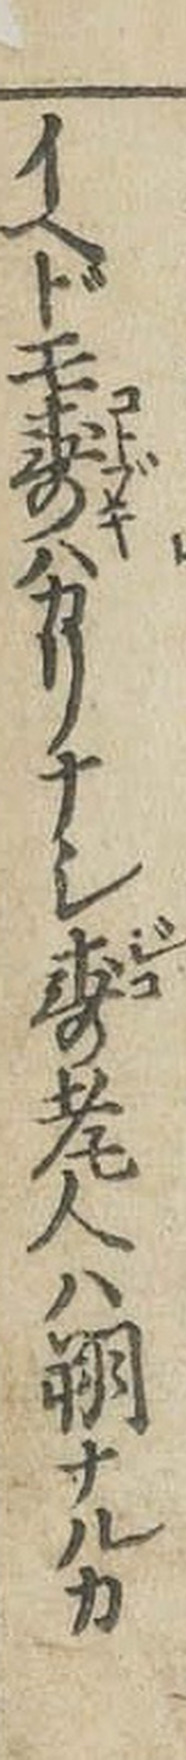イヘドモ寿ハカリナシ寿老人ハ朔ナルカ

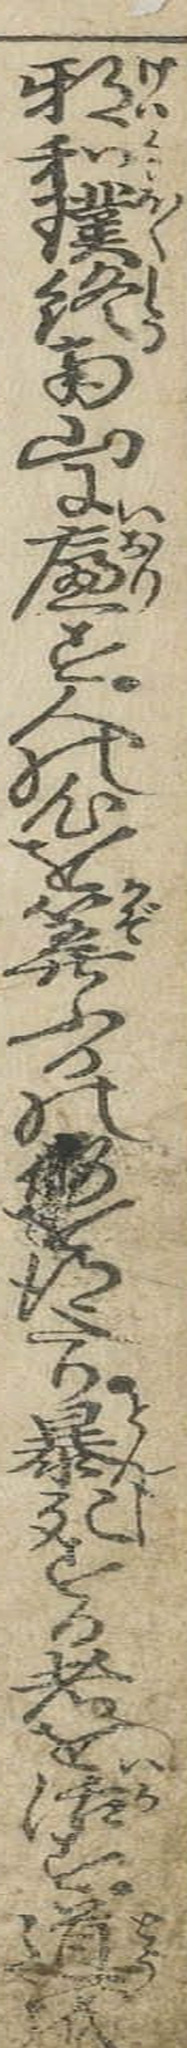邢和璞終南山に廬す。人の心を算ふるの術を得たり。暴死する者を活す。道を
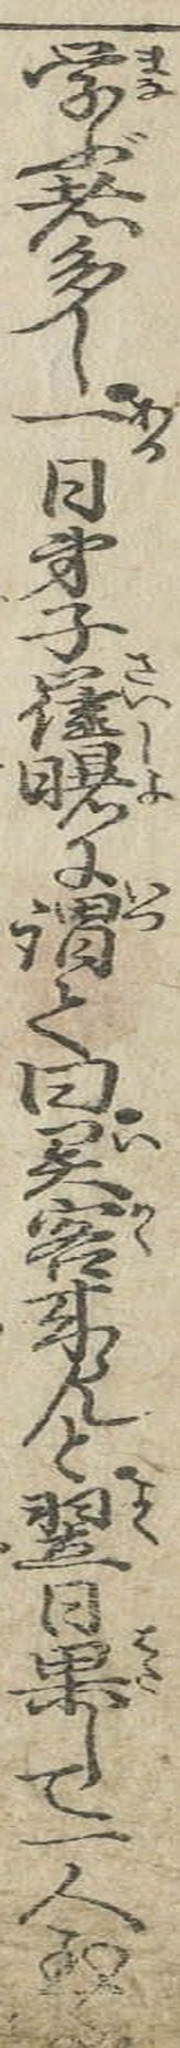学ぶ者多し。一日弟子摧曙に謂て曰。異客来らんと。翌日果して一人至る。
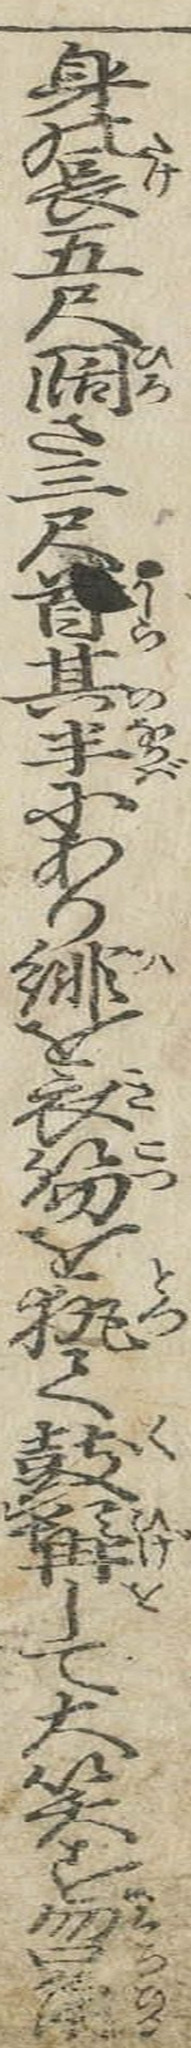身の長五尺闊さ三尺。首其の半にあり緋を衣笏を執て鼓髯して大笑す。吻角
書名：絵本写宝袋 9巻 7之巻
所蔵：東京学芸大学教育コンテンツアーカイブ
